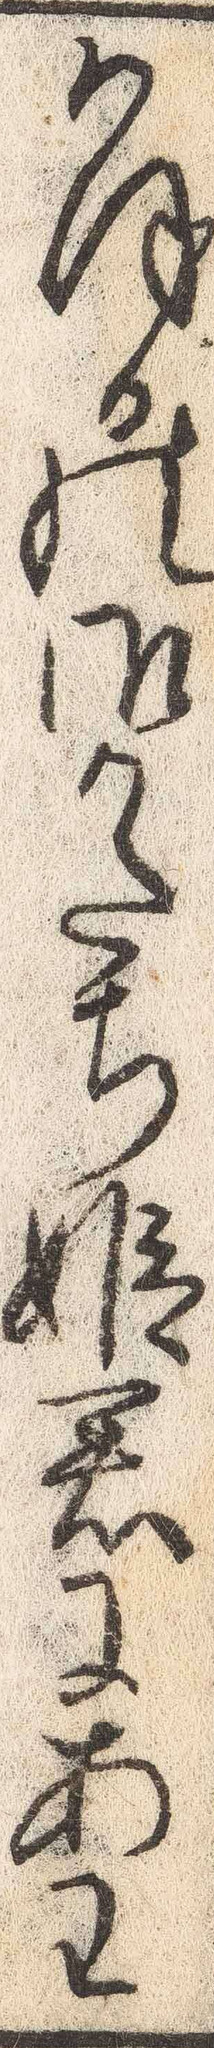かほるの御かたち姫君にあわ
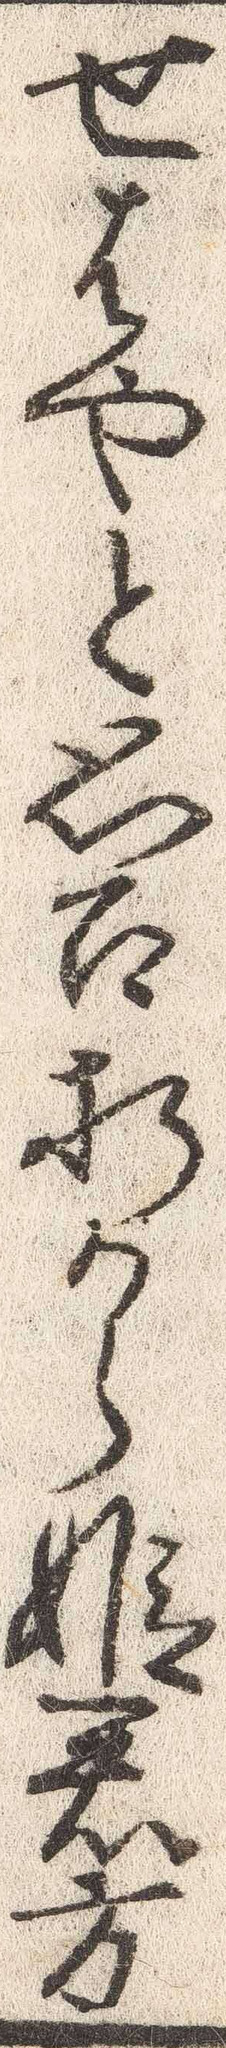せはやと思召折から姫君方
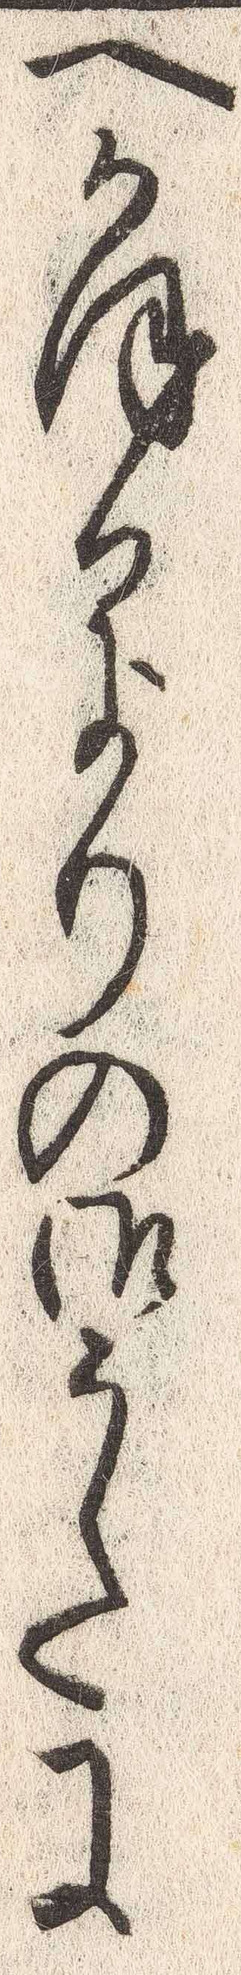へかほるよりの御うたに
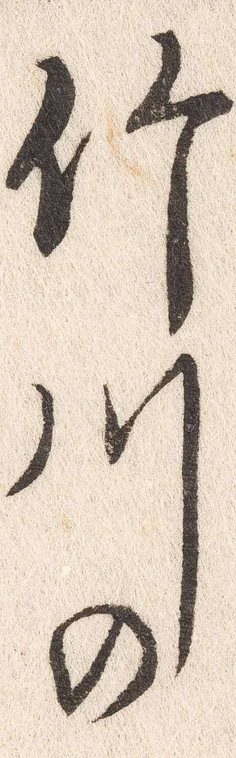竹川の
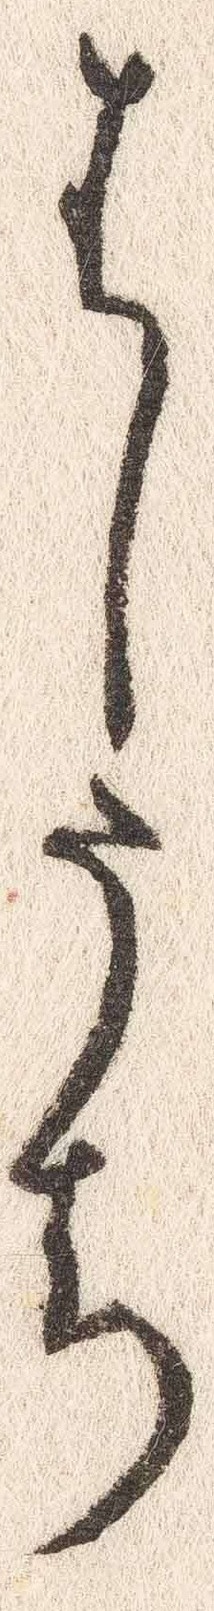はしうち
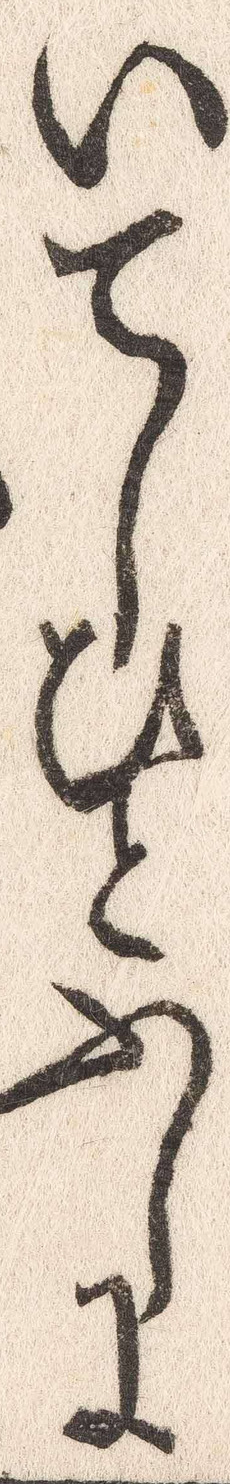いてしひとふしに
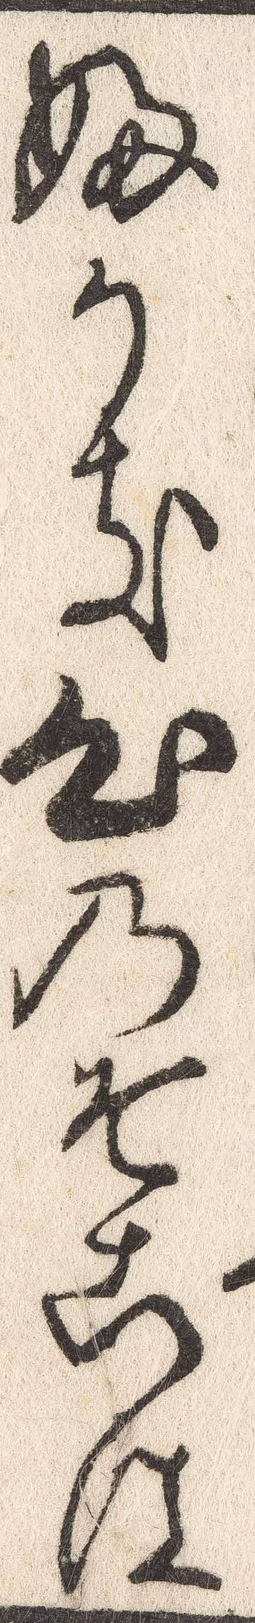ふかき心のそこは
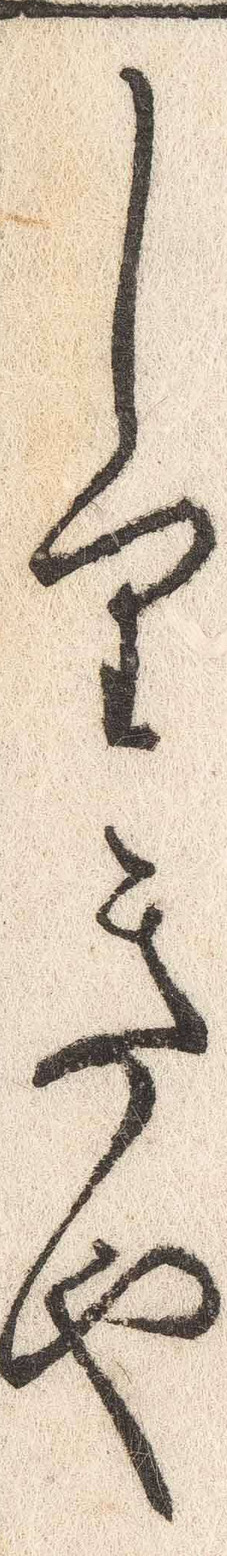しりきや

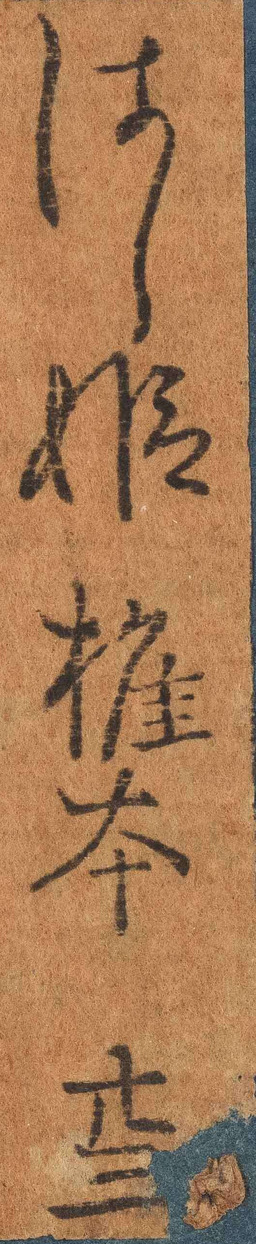はし姫椎本廿三

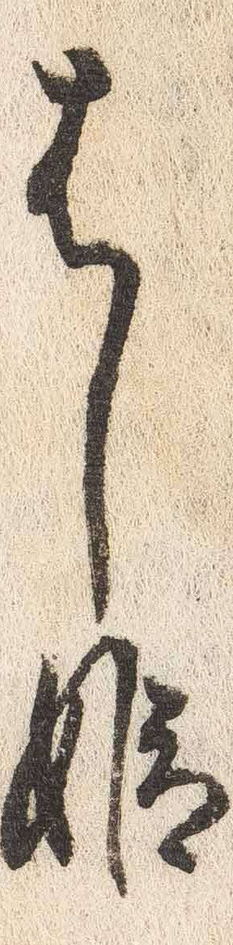はし姫
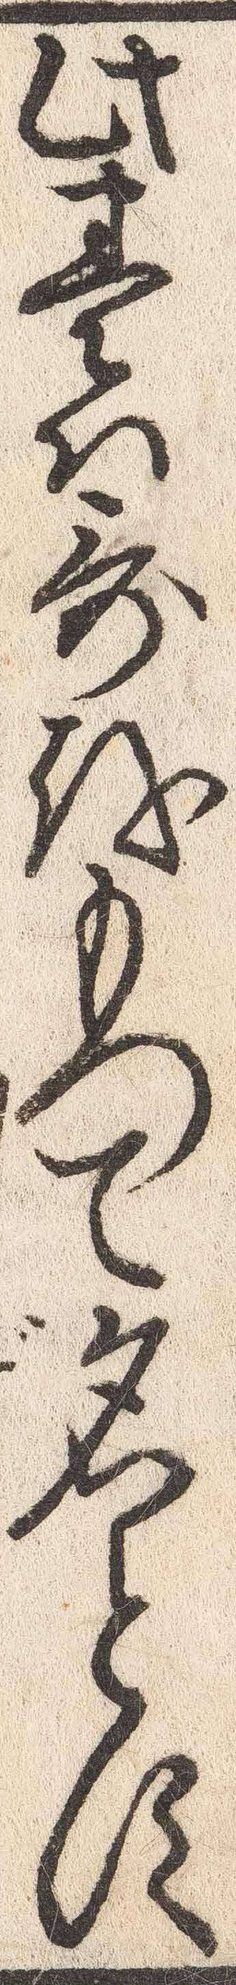此巻は歌をもつて名とす
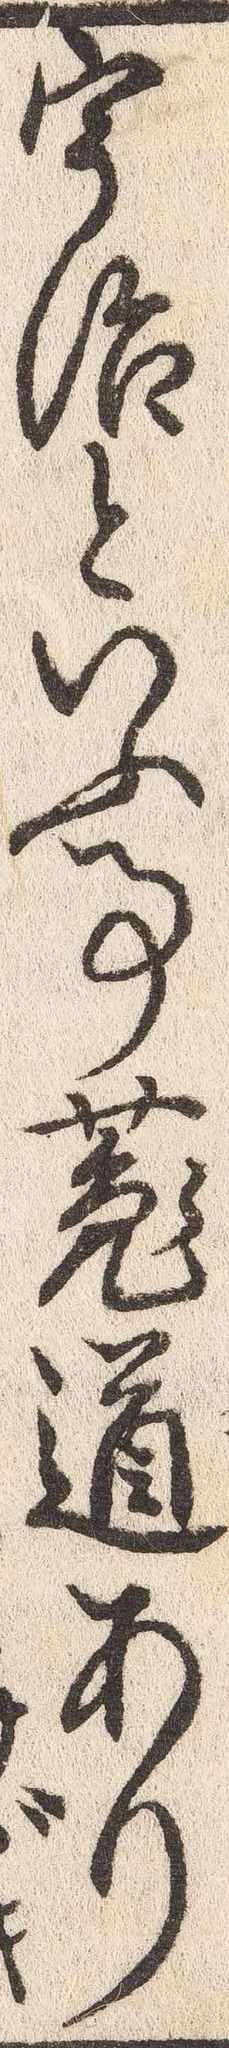宇治といふ事菟道あり
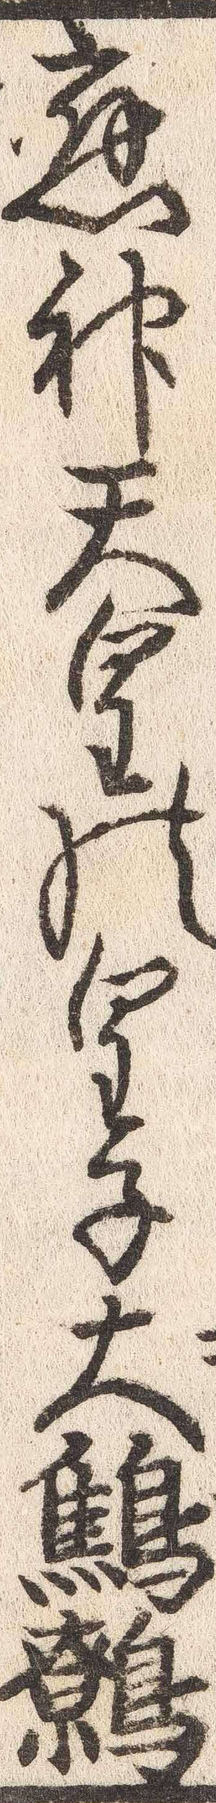応神天皇の皇子大鷦鷯
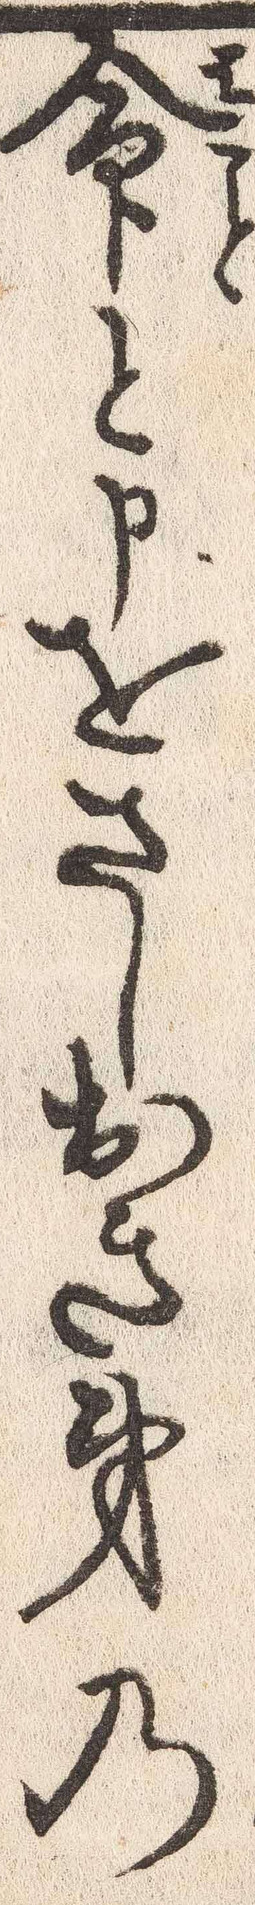命と申をさしおき弟の
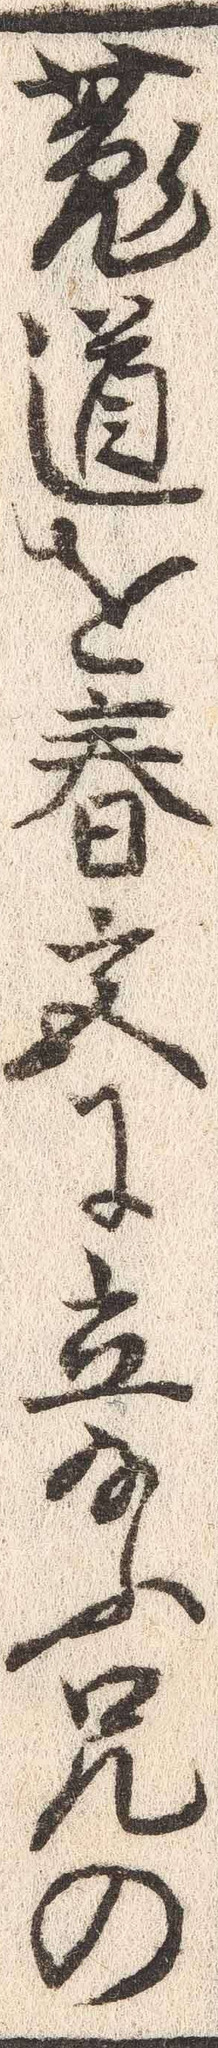菟道を春宮に立給ふ兄の
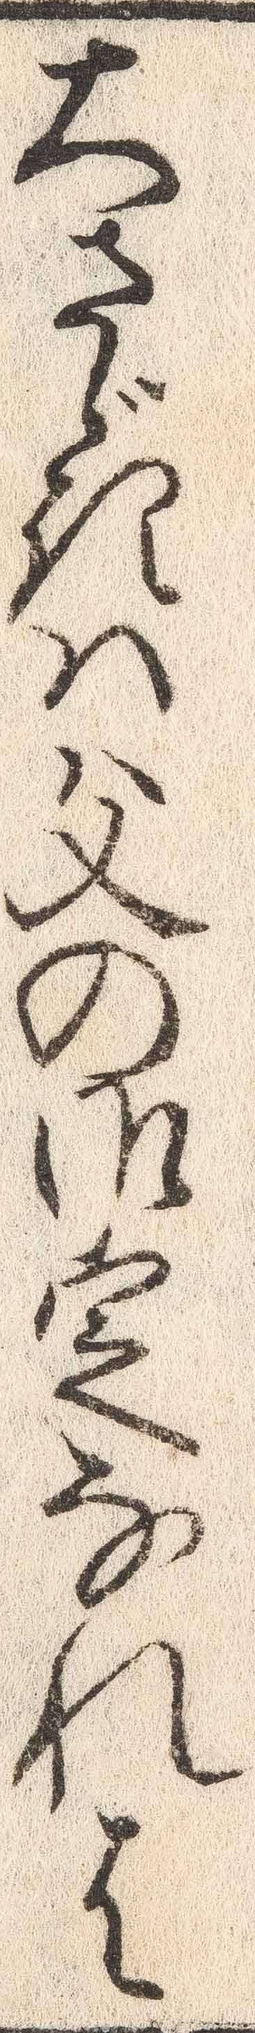大さゞきは父御定なれは
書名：源氏物語
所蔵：東京学芸大学附属図書館 国文学研究資料館
